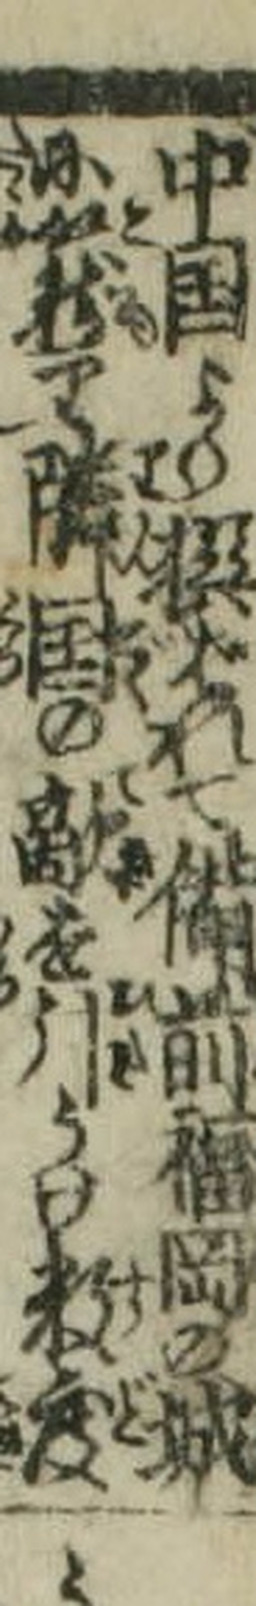に籠り隣国の敵を引うけ数度
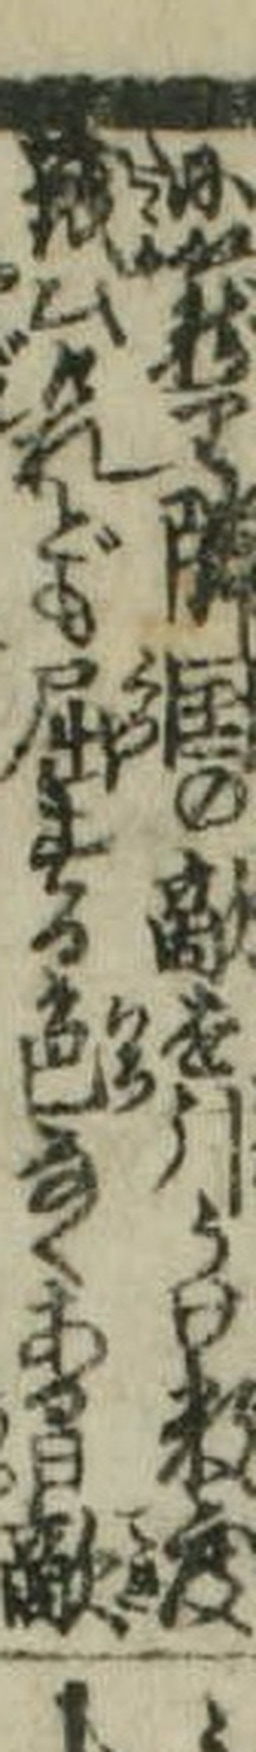戦ひけれども屈する色なくある日敵
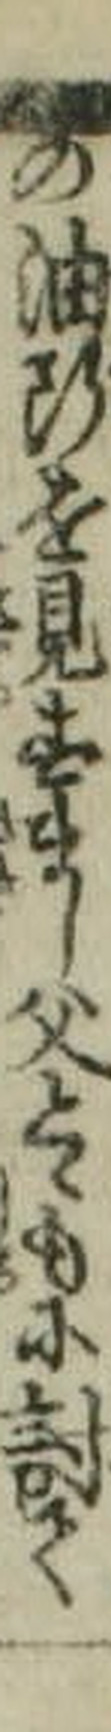の油断を見すまし父とゝもに討て
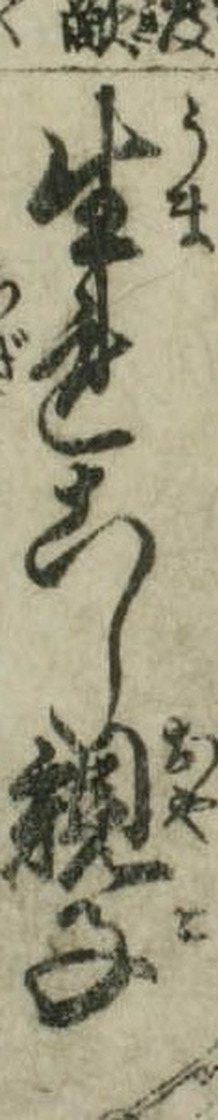生れこ親子
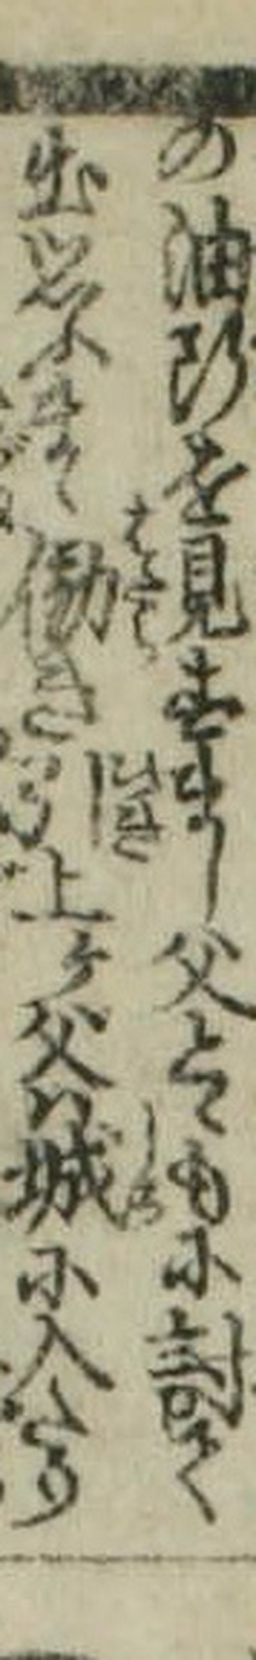出思ふまゝ働き引上け父は城に入たり
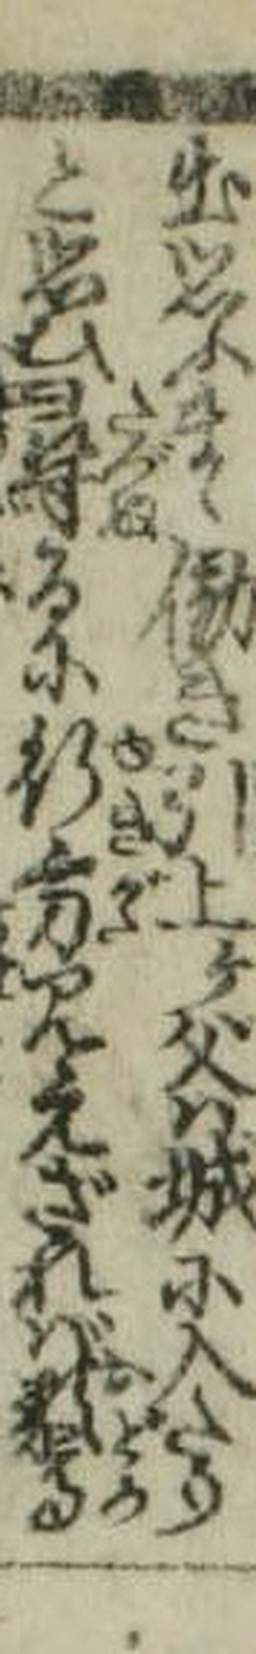と思ひ尋るに行方見えざれば驚
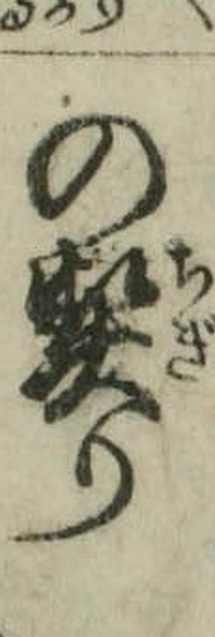の契り
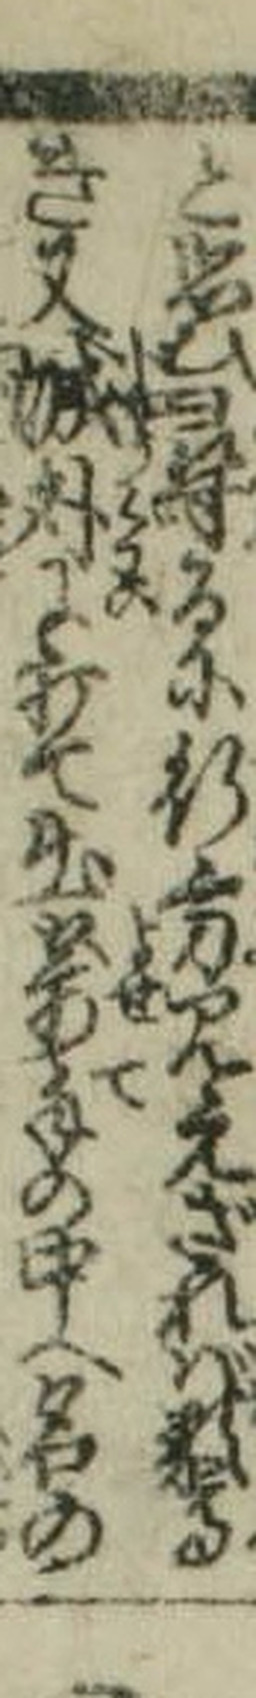き又城外に打て出寄手の中へ名の
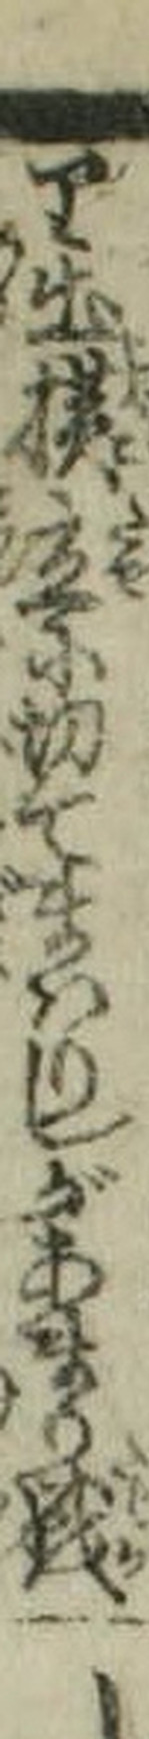り出横立に切てまはりしがあまり戦
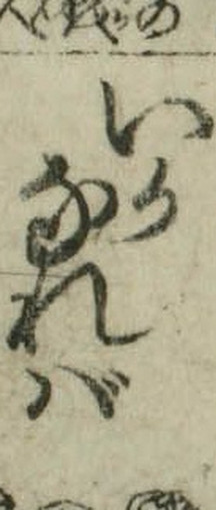なれば
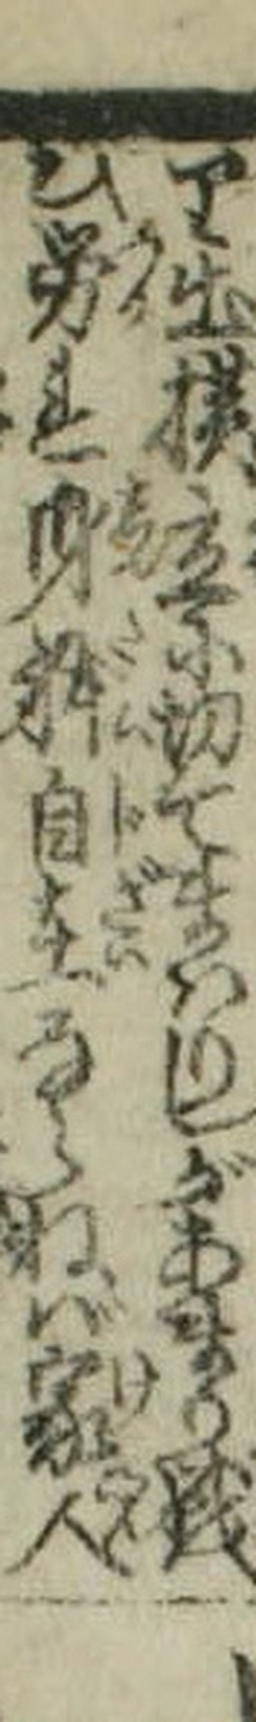ひ労れ身躰自在ならねば家人
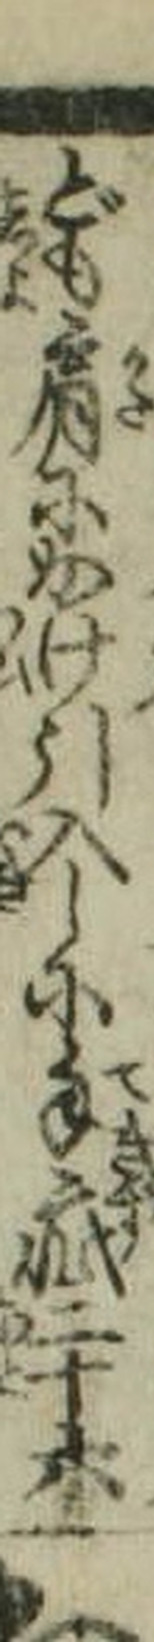ども肩にかけ引入しに手疵二十六
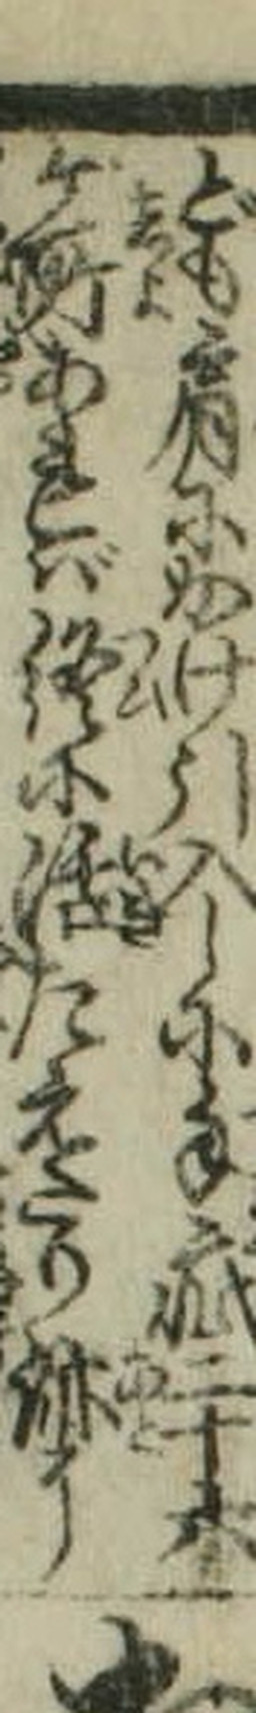ケ所あれば終に活たえたり跡に
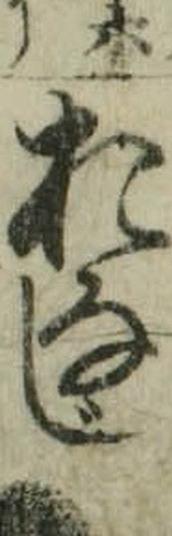おなじ
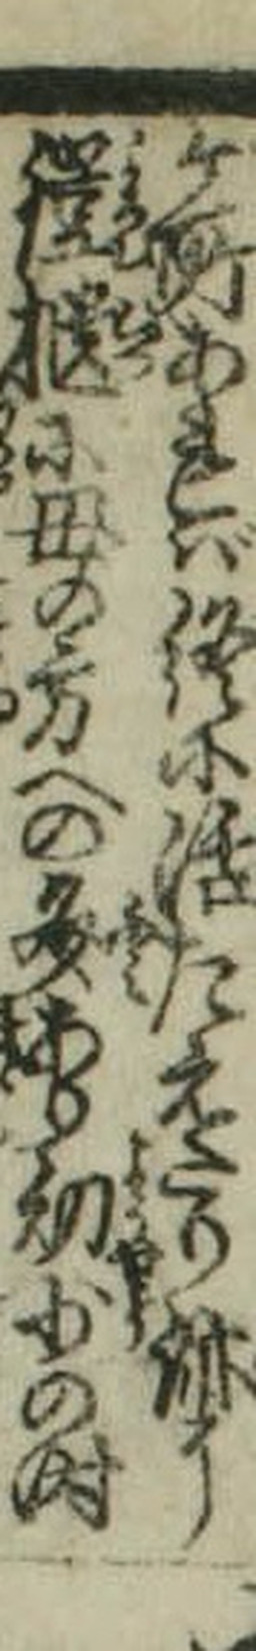鎧櫃に母の方への文あり幼少の時
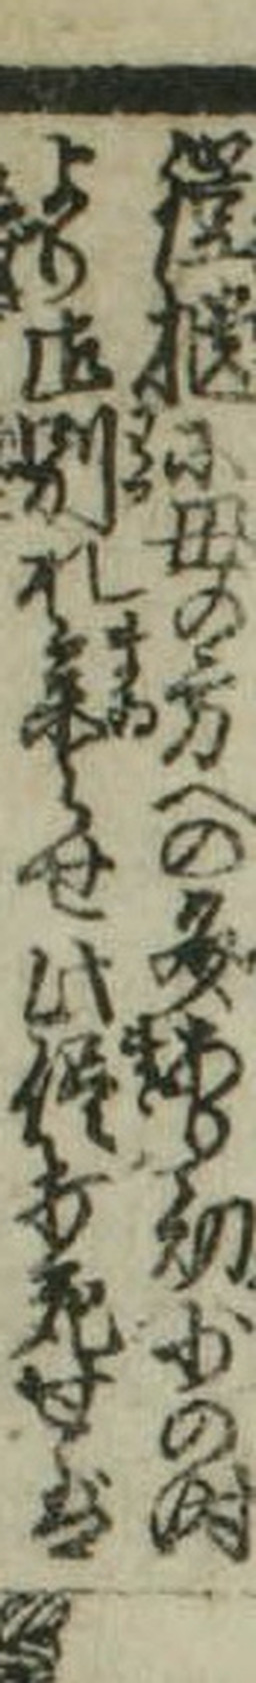より御別れ参らせ此侭打死せば
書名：續英雄百人一首
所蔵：東京学芸大学附属図書館
